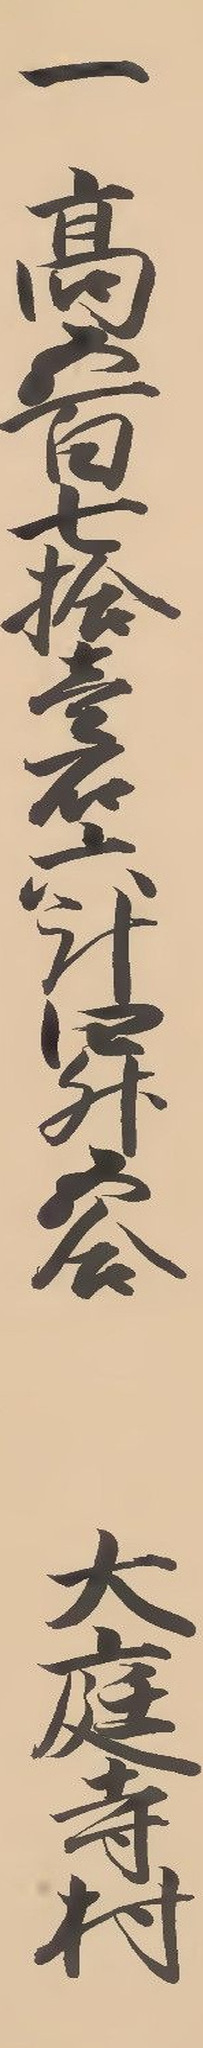一高五百七拾壱石六斗四升五合大庭寺村

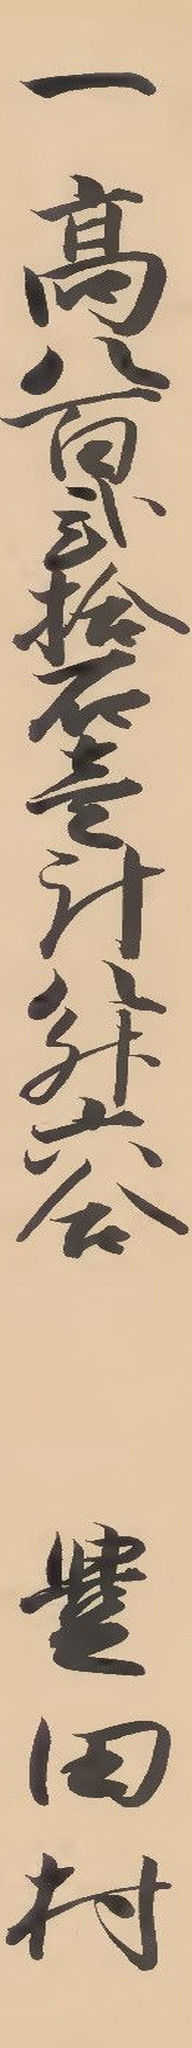一高八百弐拾石壱斗八升六合豊田村
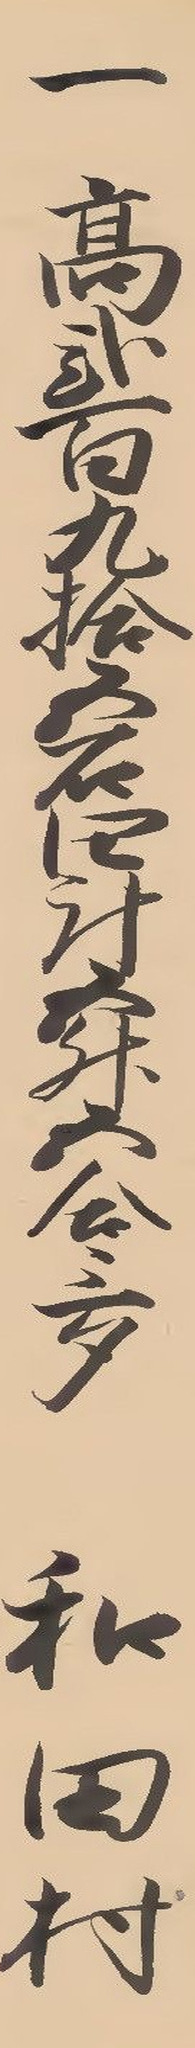一高弐百九拾五石四斗五升五合三勺和田村
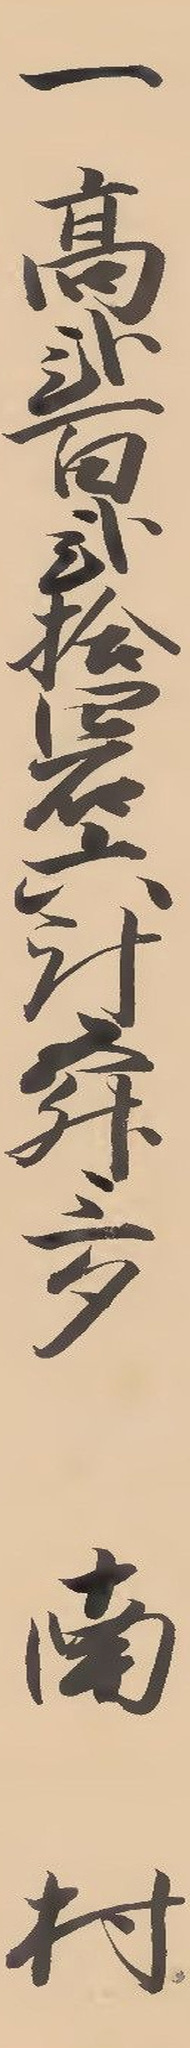一高弐百弐拾四石六斗五升三勺南村
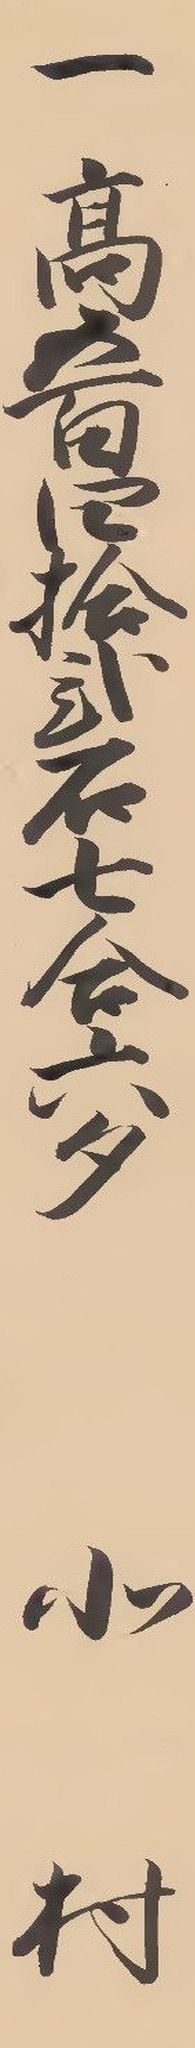一高五百四拾弐石七合六勺北村
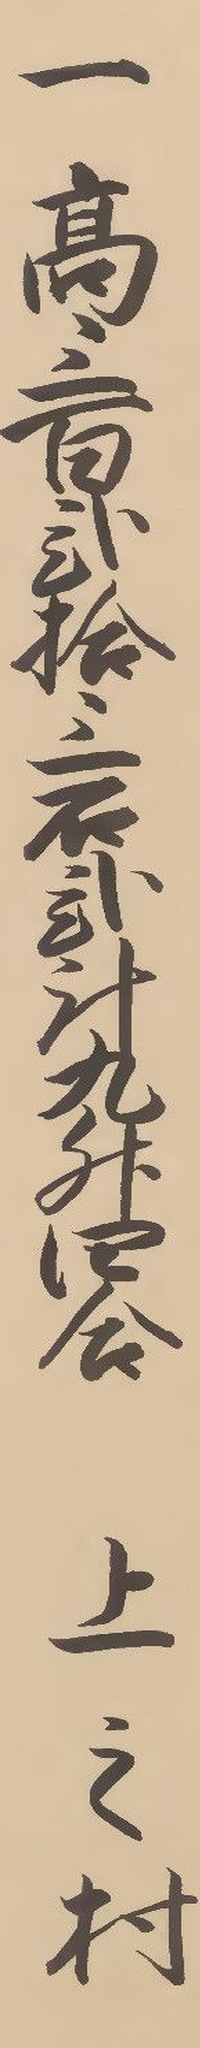一高三百弐拾三石弐斗九升四合上之村
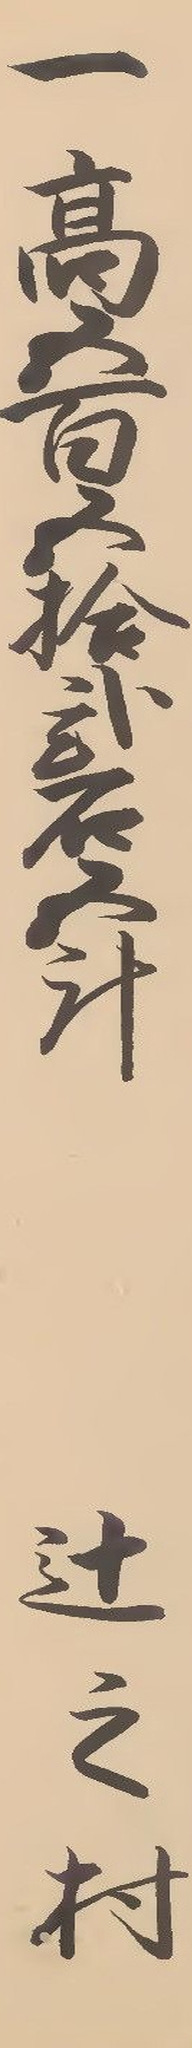一高五百五拾弐石五斗辻之村
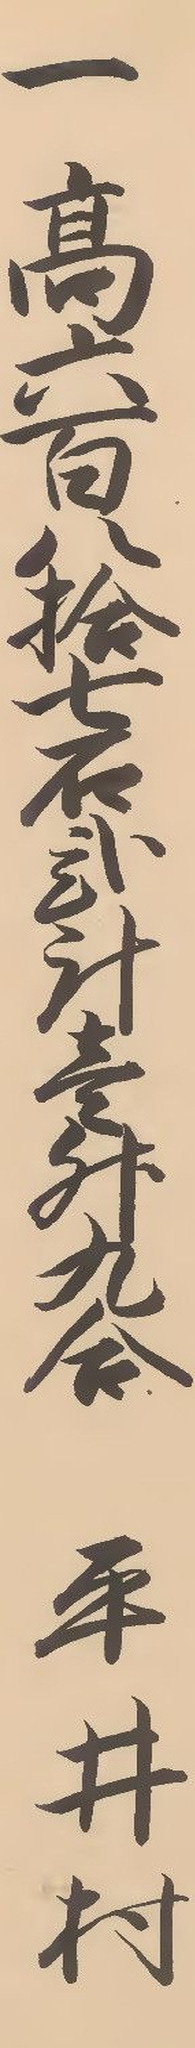一高六百八拾七石弐斗壱升九合平井村

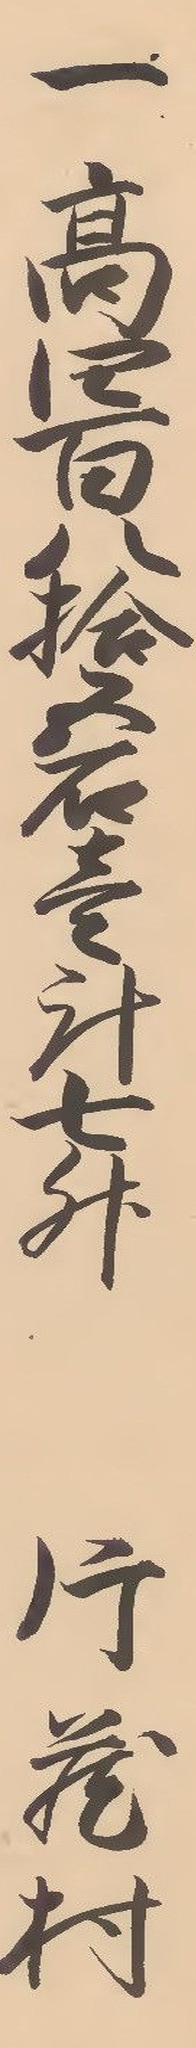一高四百八拾五石壱斗七升片蔵村
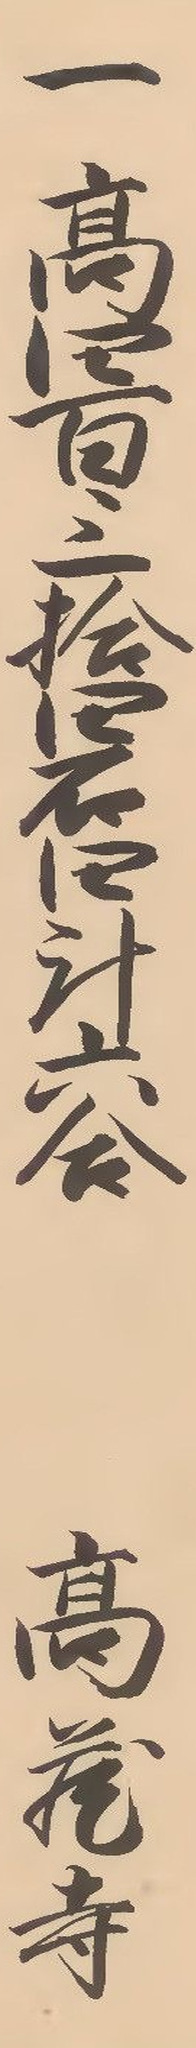一高四百三拾四石四斗六合高蔵寺
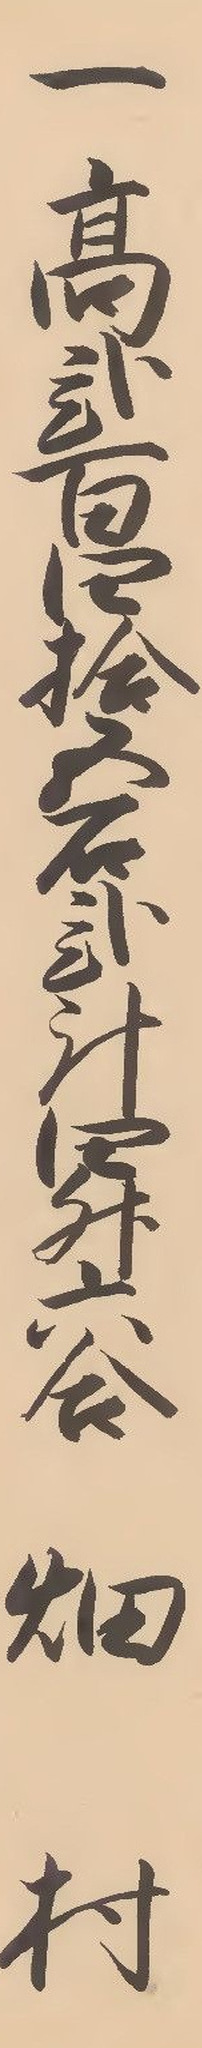一高弐百四拾五石弐斗四升六合畑村
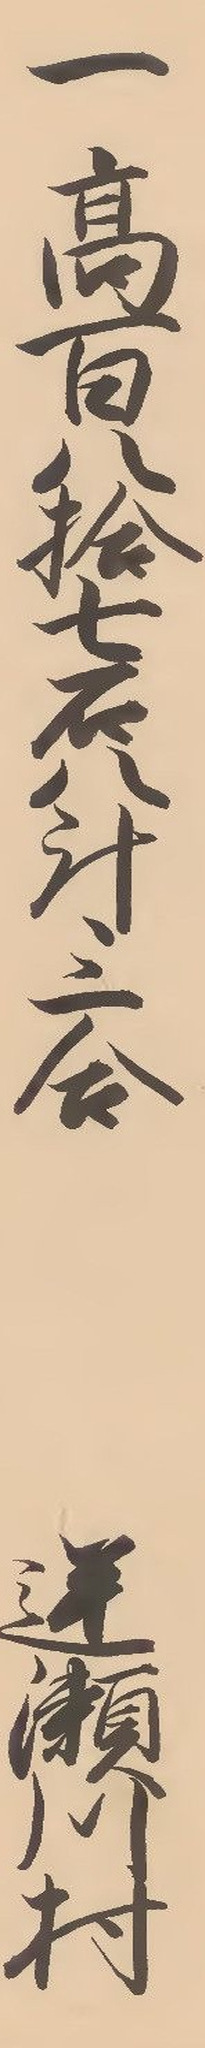一高百八拾七石八斗三合逆瀬川村
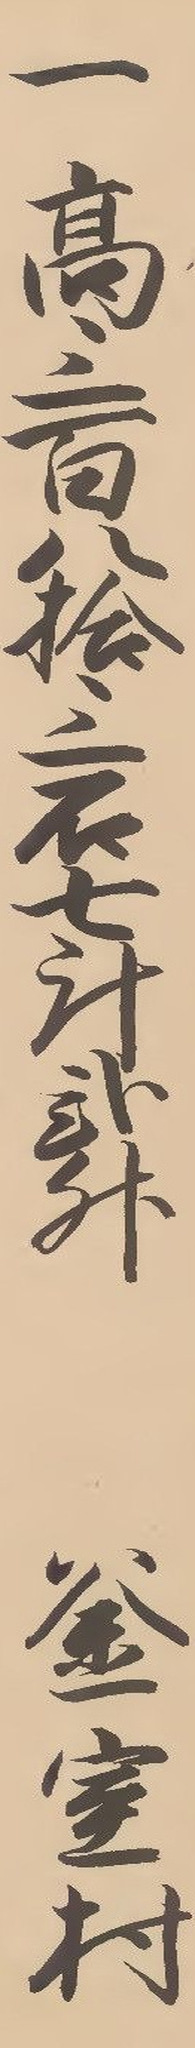一高三百八拾三石七斗弐升釜室村
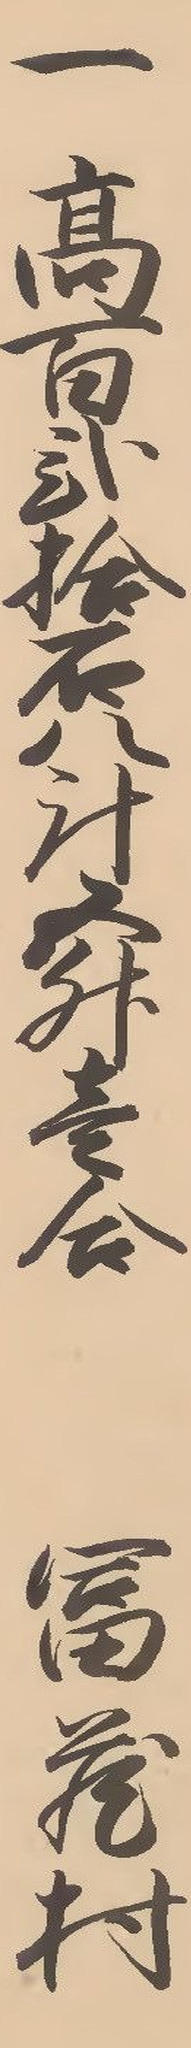一高百弐拾石八斗五升壱合富蔵村
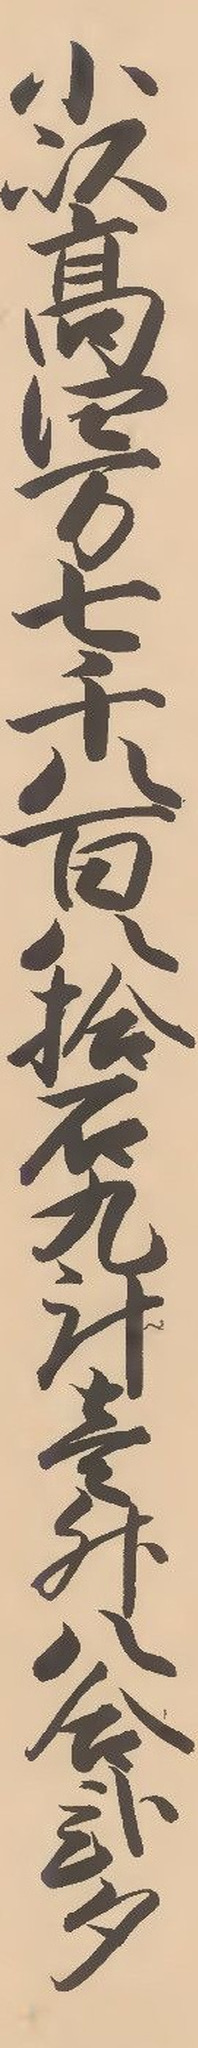小以高四万七千八百八拾石九斗壱升八合弐勺

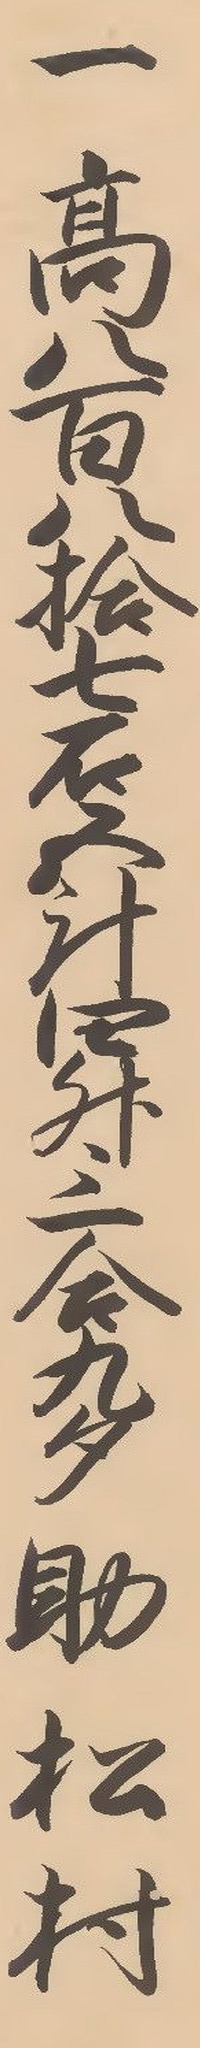一高八百八拾七石五斗四升三合九勺助松村
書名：和泉国郷帳
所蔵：国立公文書館 National Archives of Japan
